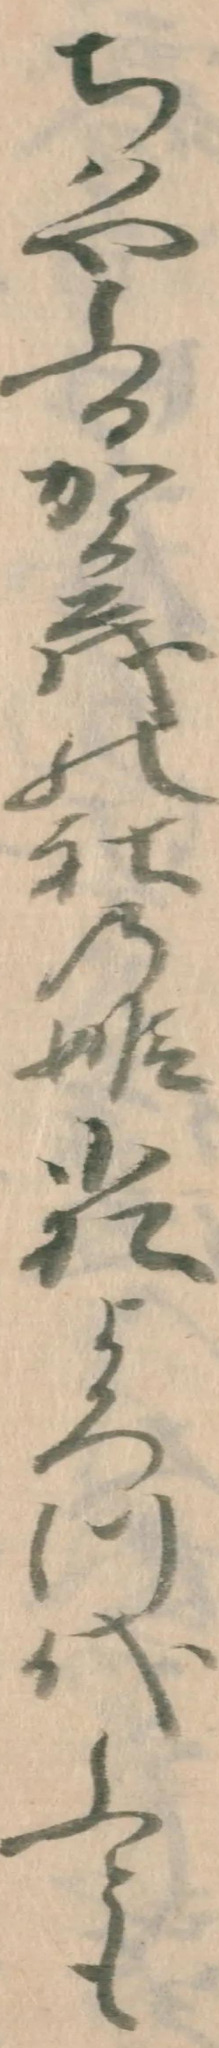ちはやふる賀茂の社の姫小松よろつ代ふとも
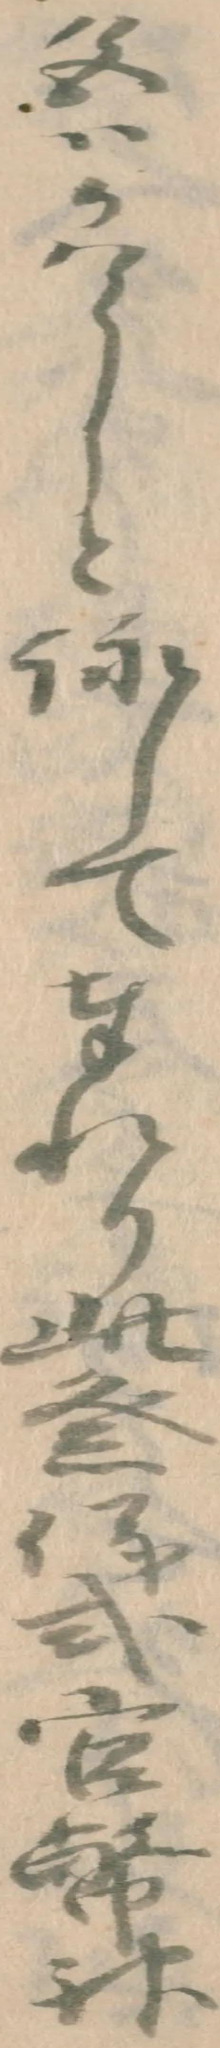色はかはらしと詠して奉れり此祭儀式官幣神
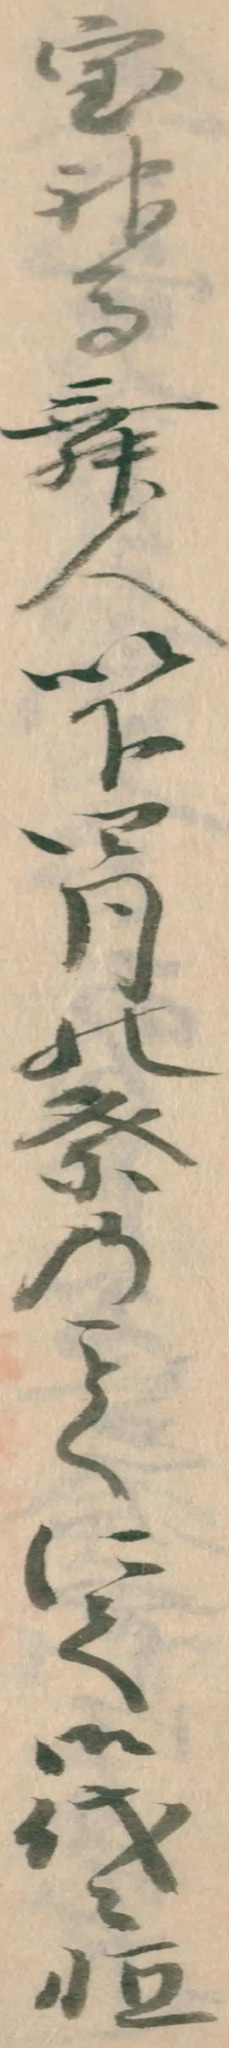宝神馬舞人以下四月の祭のことくにて御代々恒
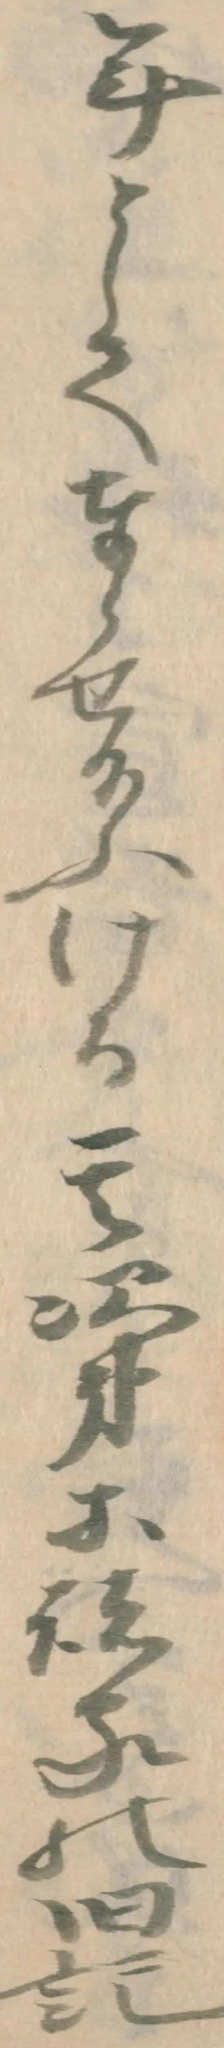年として奉らせ給ふける其次第等諸家の旧記
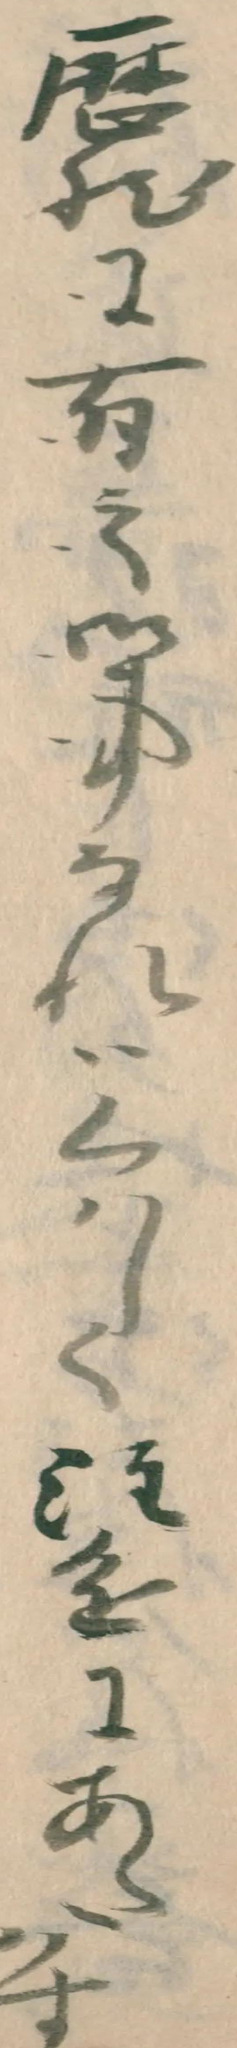歴然に有之御事なれはくはしく注進にあたはす
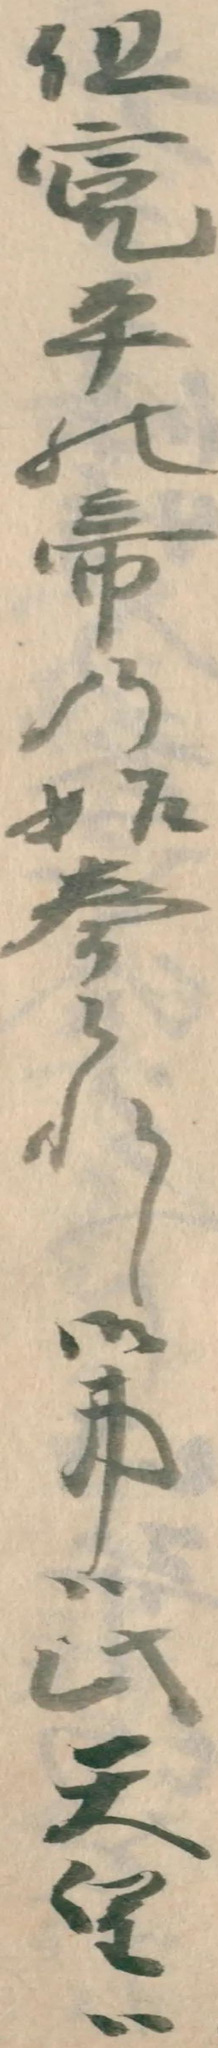但寛平の帝の始奉られし御事は此天皇は
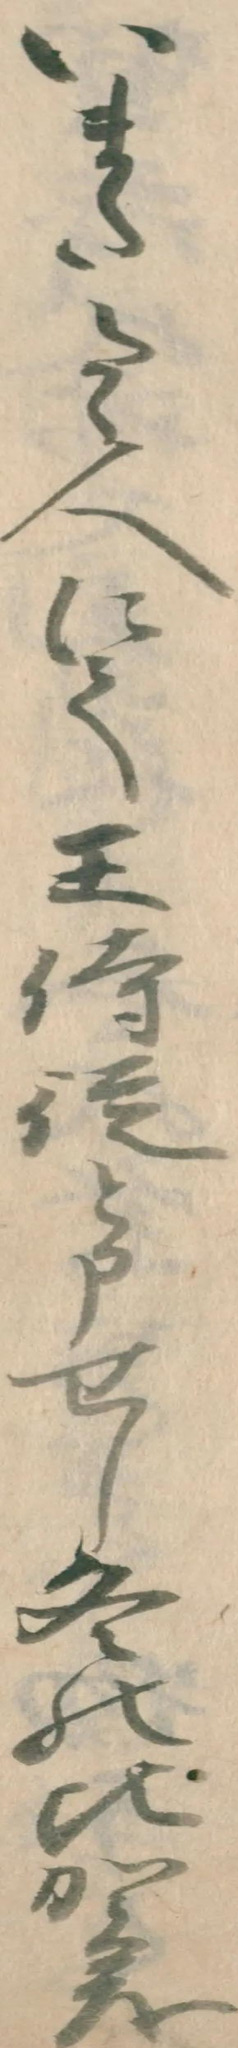いまたたゝ人にて王侍従と申せし冬の比賀茂
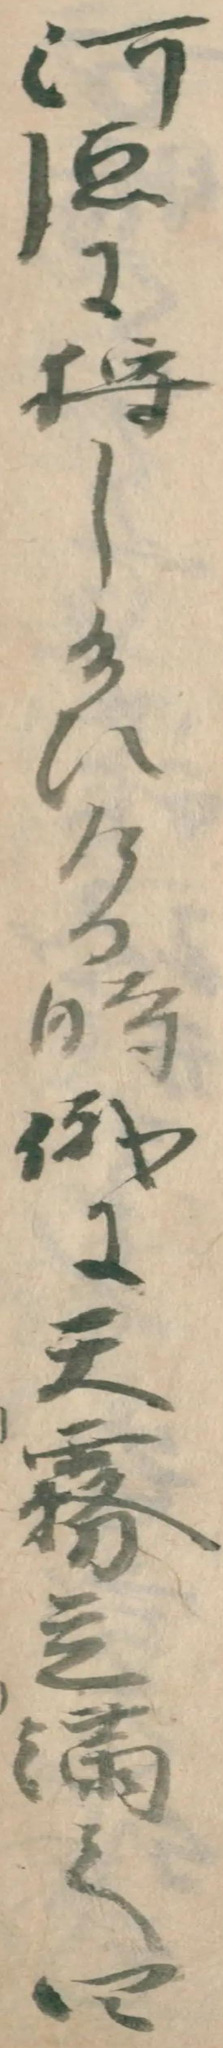河原に狩し給ひける時俄に天-霧立-満て四

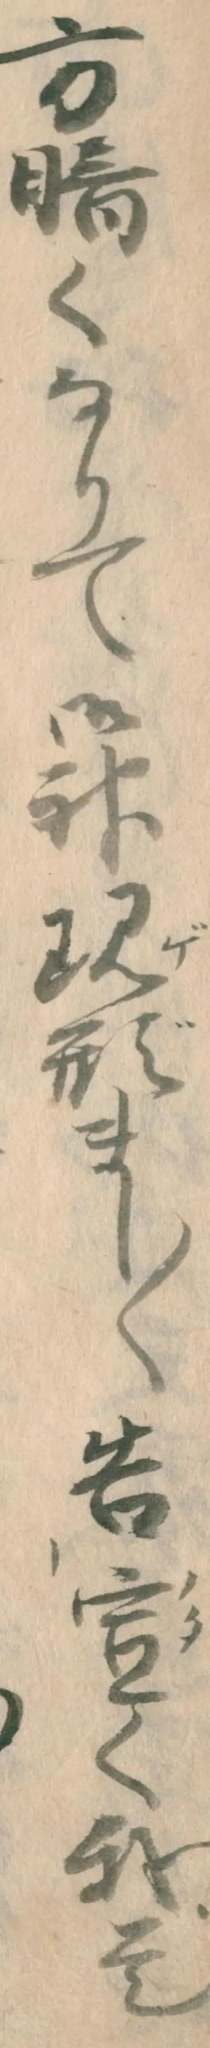方暗くなりて御神現形まし〳〵告-宣く我是
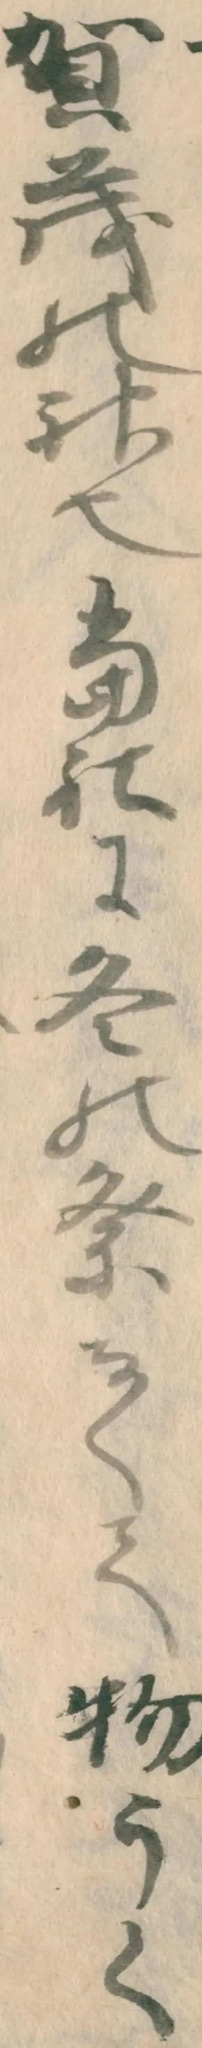賀茂の神也当社に冬の祭なくて物うく
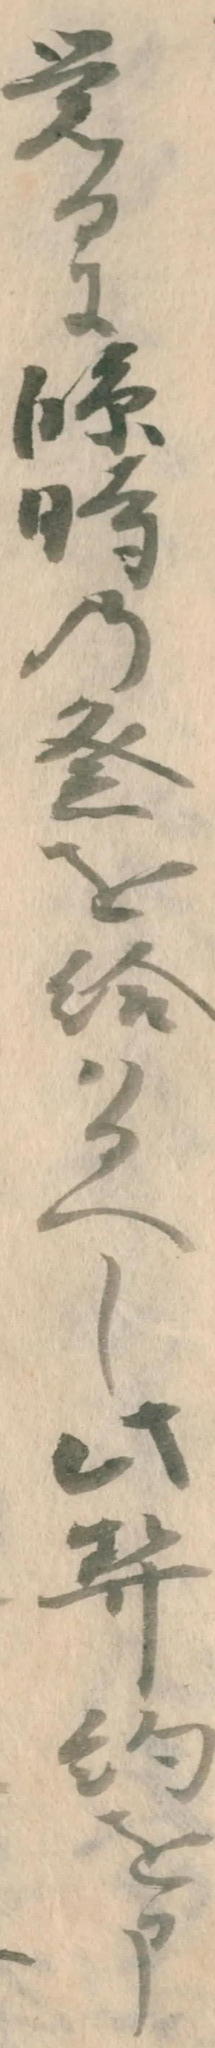覚るに臨時の祭を給はるへし此契約を申
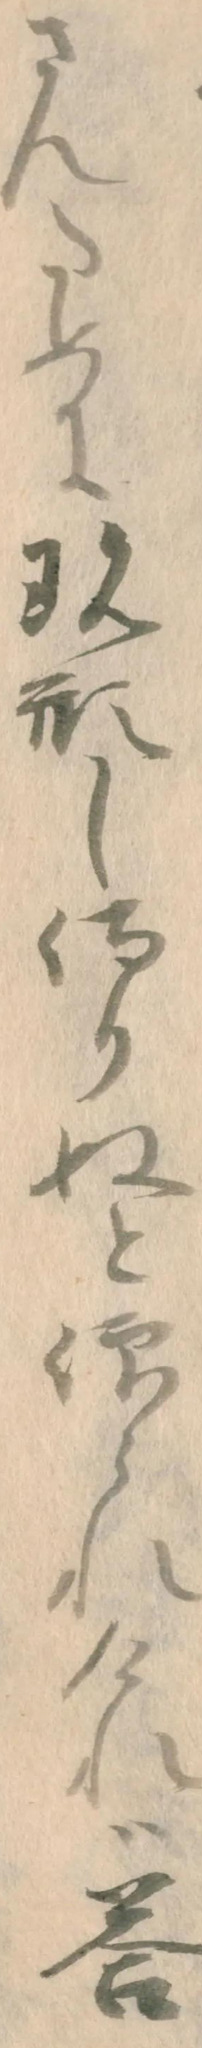さんために現形し侍りぬと仰られけれは答
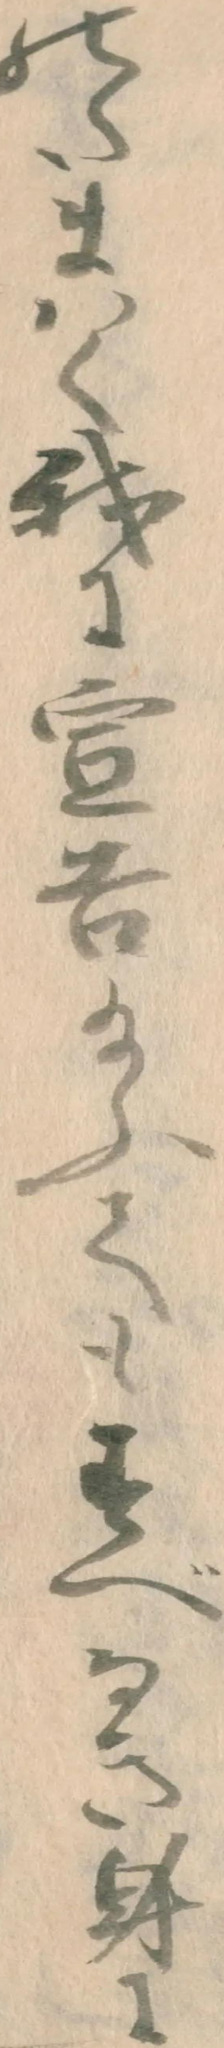のたまはく我に宣告給ふてもすべなき身に
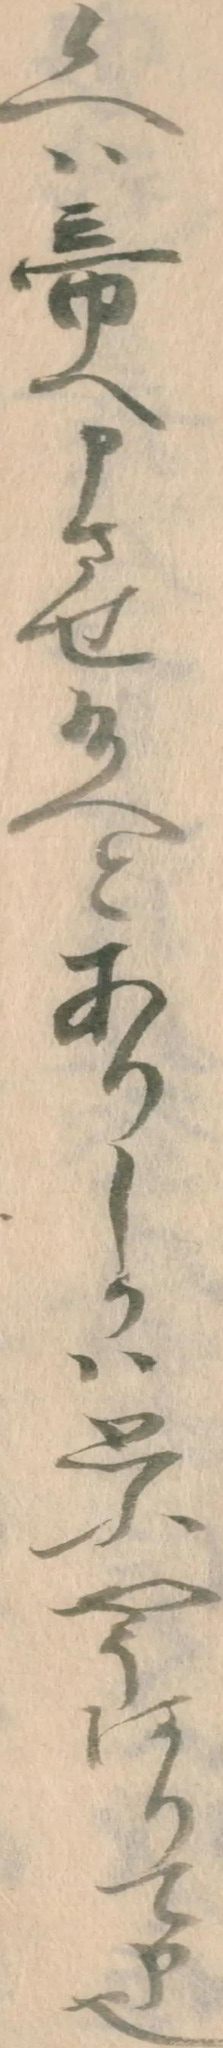候へは帝へ申させ給へとありしかは思ふやうありて申也
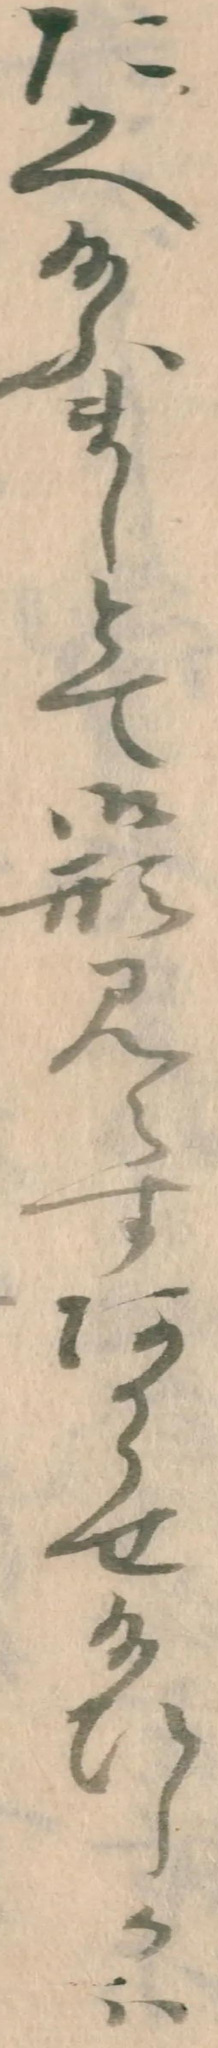たかへ給ふましとて御形見えすあからせ給ひしかは
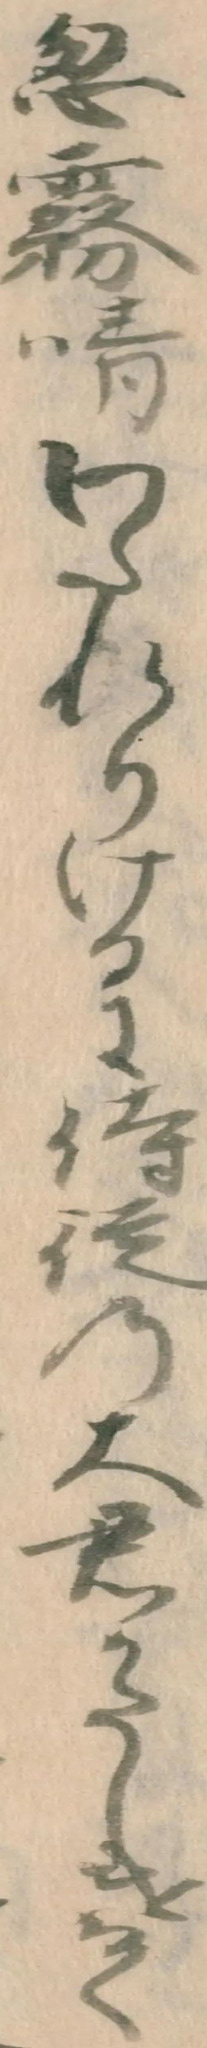忽霧晴わたれりけるに侍従の大君かたしけなく
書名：賀茂社記録. 第1冊
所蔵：国立国会図書館 National Diet Library, JAPAN
